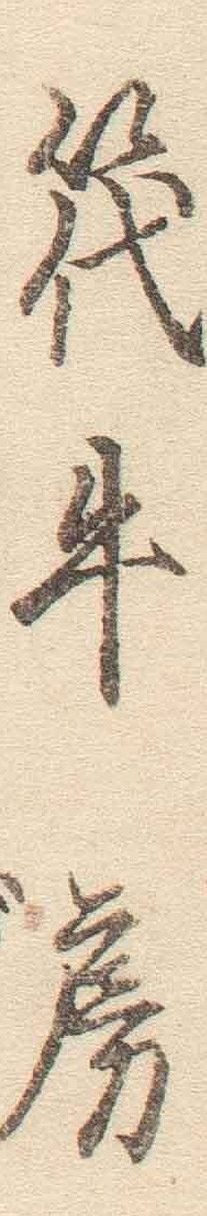筏牛蒡
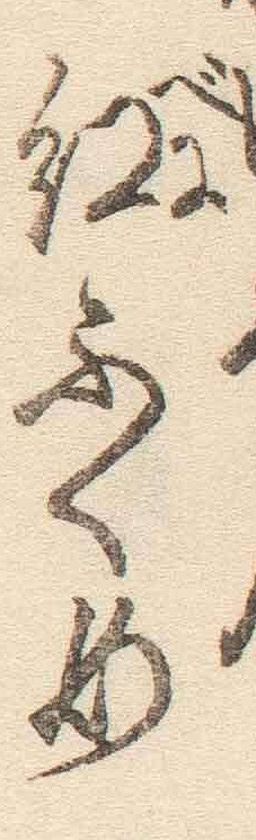紅ふくめ
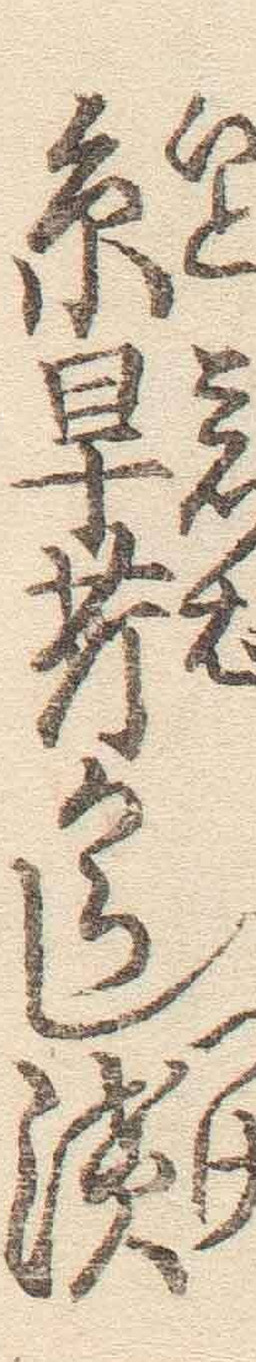糸早芹からし漬
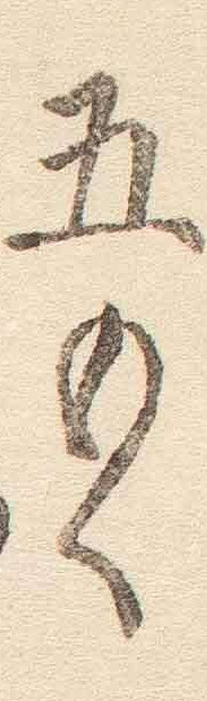五もく
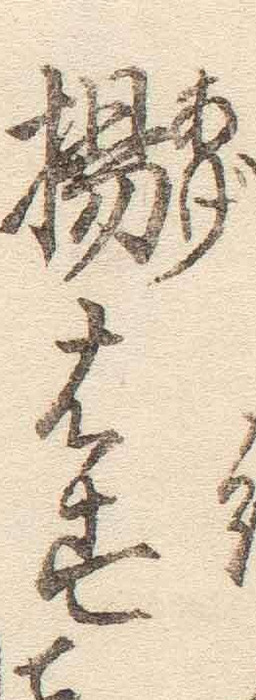揚はす
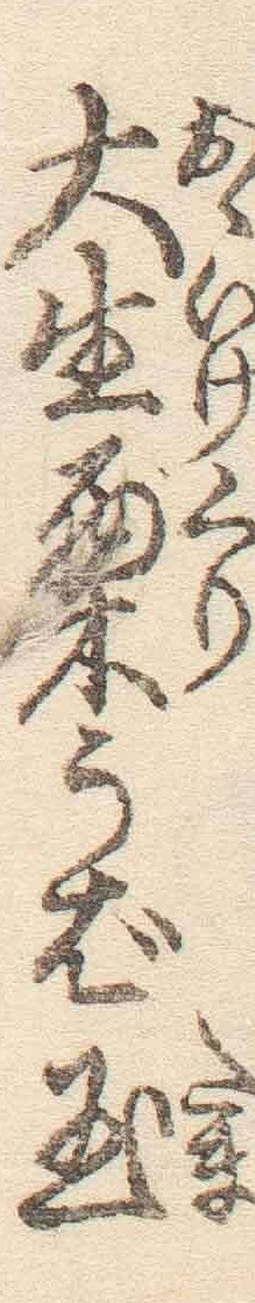大生栗うば玉
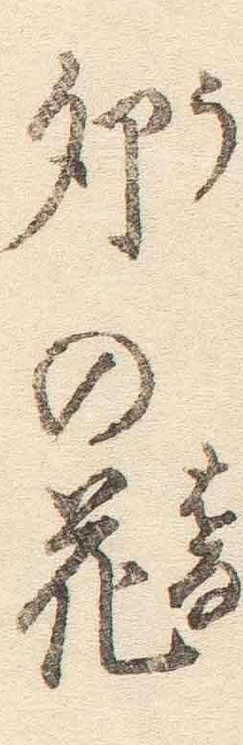卯の花
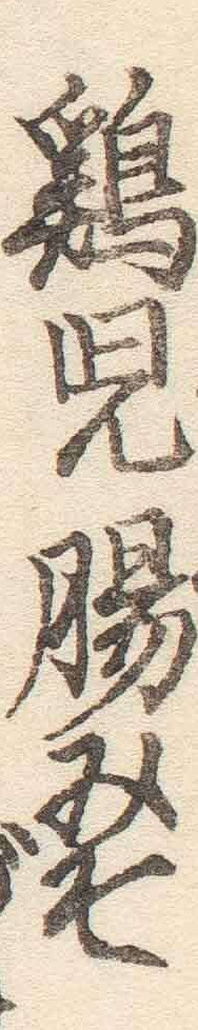鶏児腸みそ
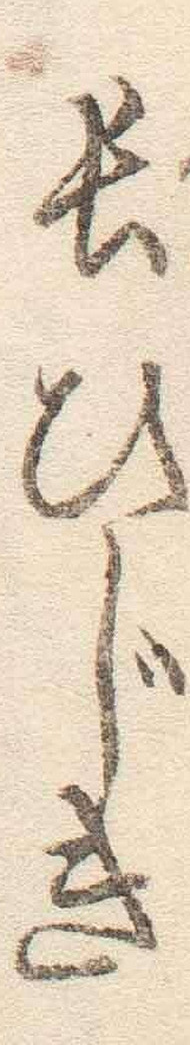長ひじき
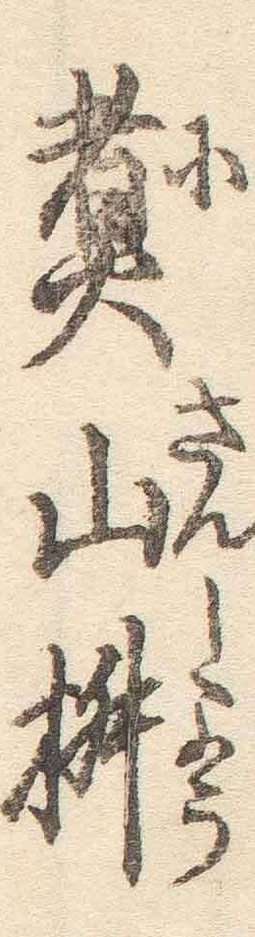煮山枡
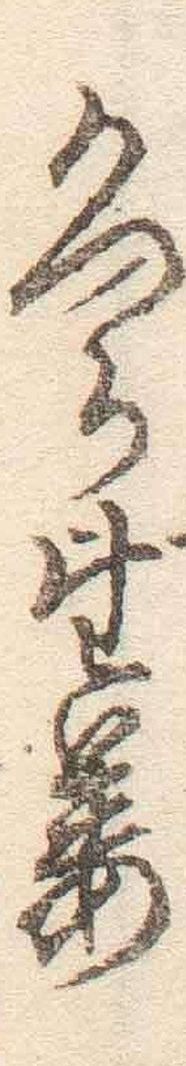かつら生姜
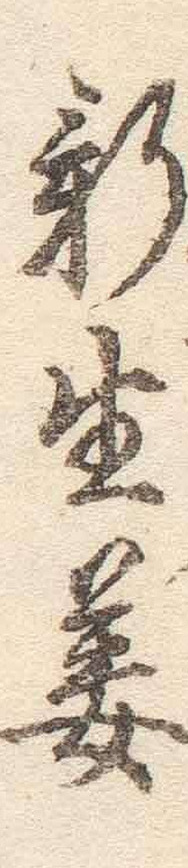新生姜
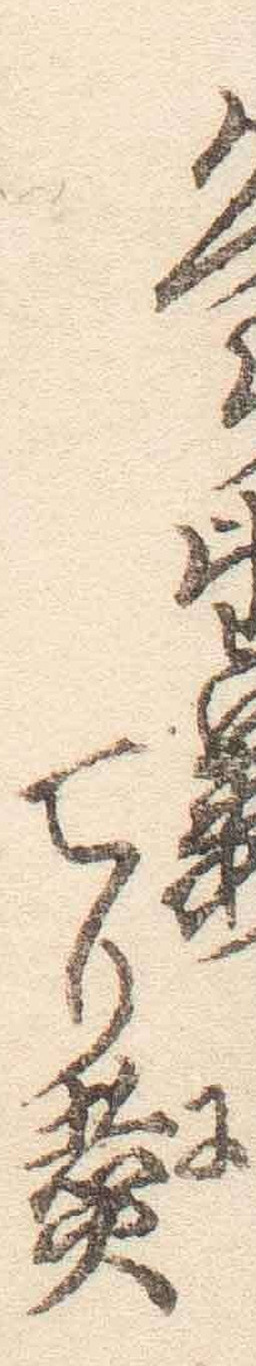てり煮
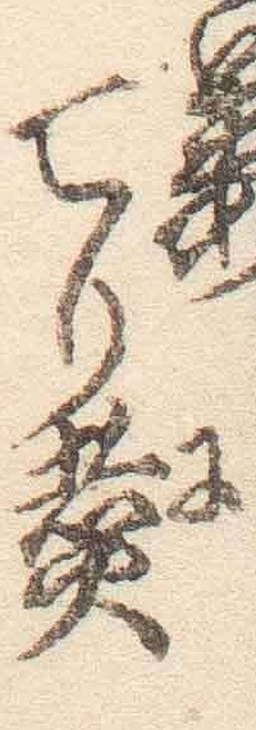てり煮
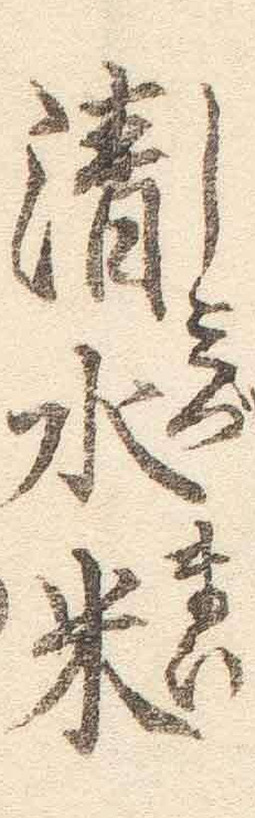清水米
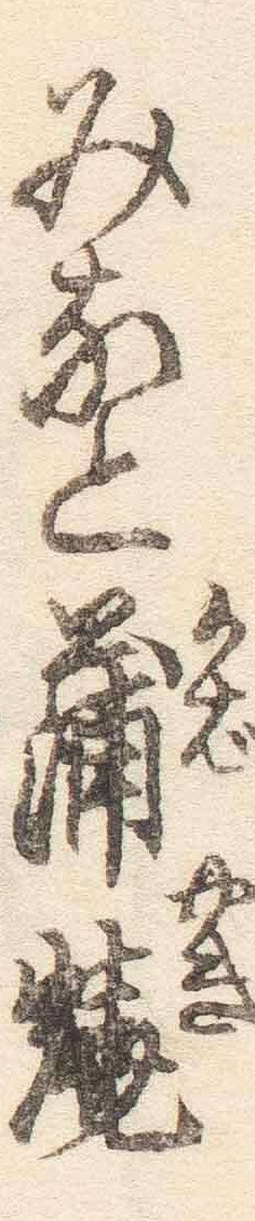みなと蒲焼
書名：料理通
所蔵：東京学芸大学附属図書館 国文学研究資料館
